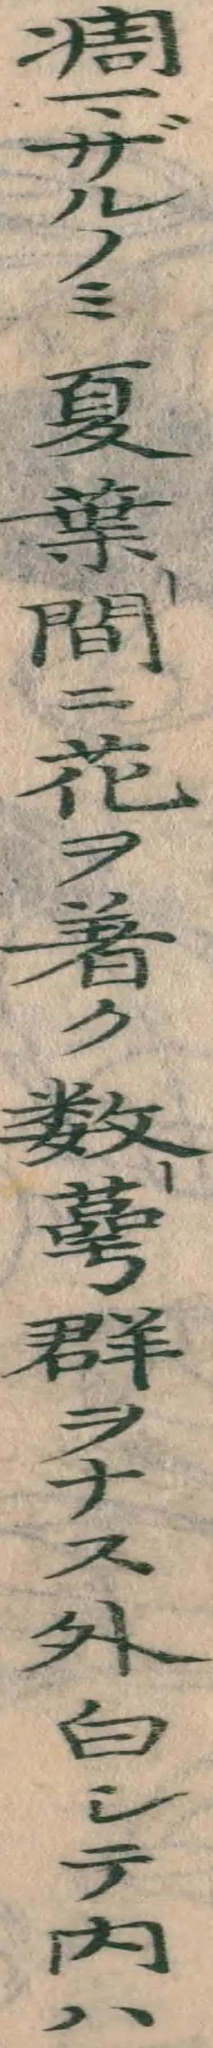凋マザルノミ夏葉-間ニ花ヲ着ク数-萼群ヲナス外白シテ内ハ
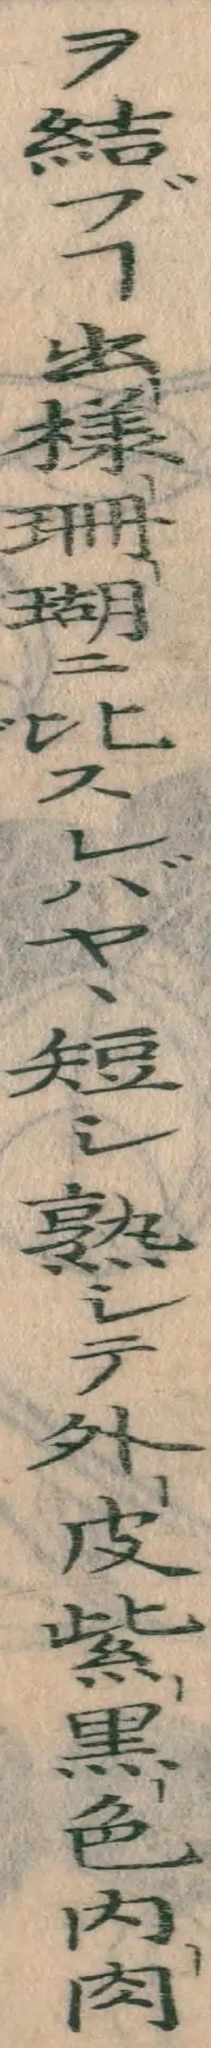ヲ結ブヿ出-様-珊-瑚ニ比スレバヤヽ短シ熟シテ外-皮紫-黒-色内-肉

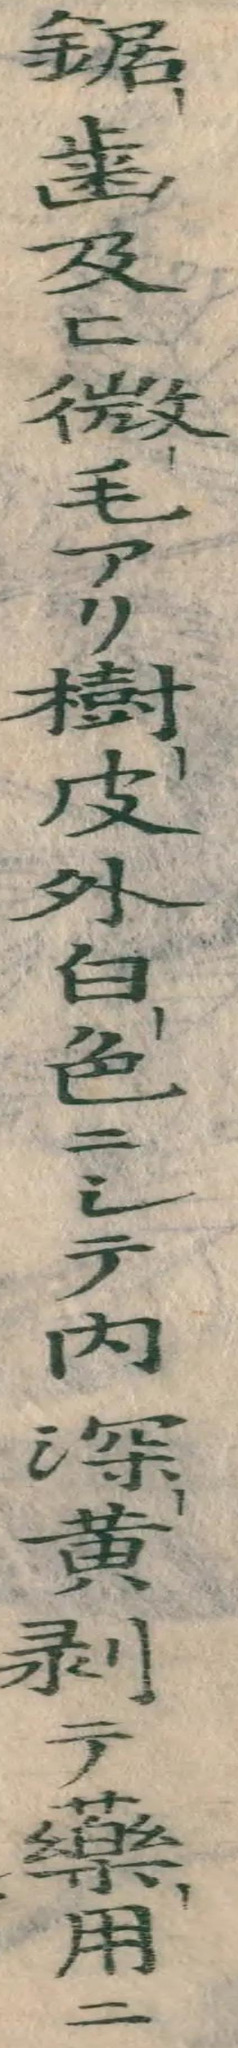鋸-歯及ヒ微-毛アリ樹-皮外白-色ニシテ内深-黄剥テ薬-用ニ
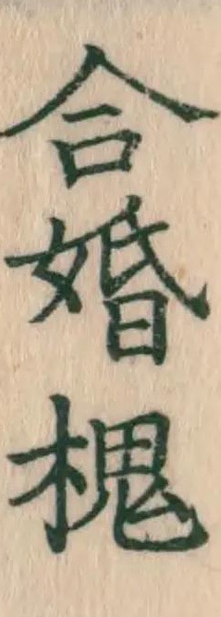合婚槐

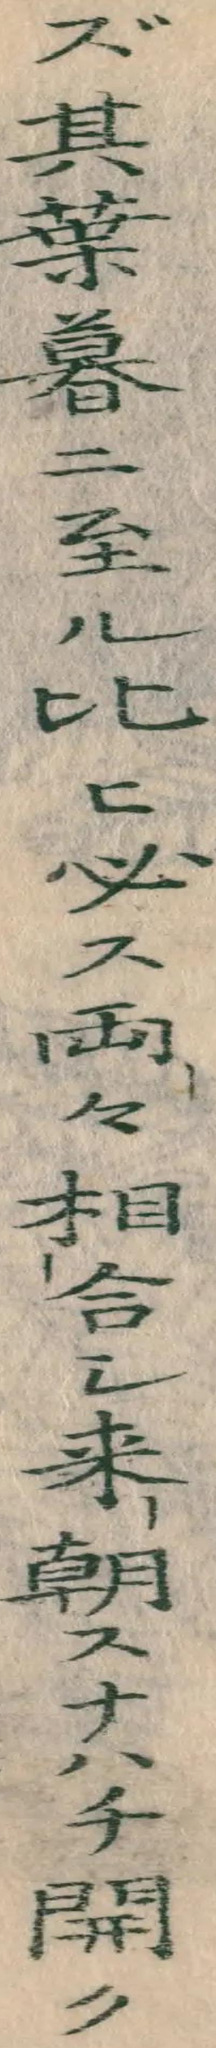ズ其葉暮ニ至ル比ヒ必ス両-々相-合シ来-朝スナハチ開ク
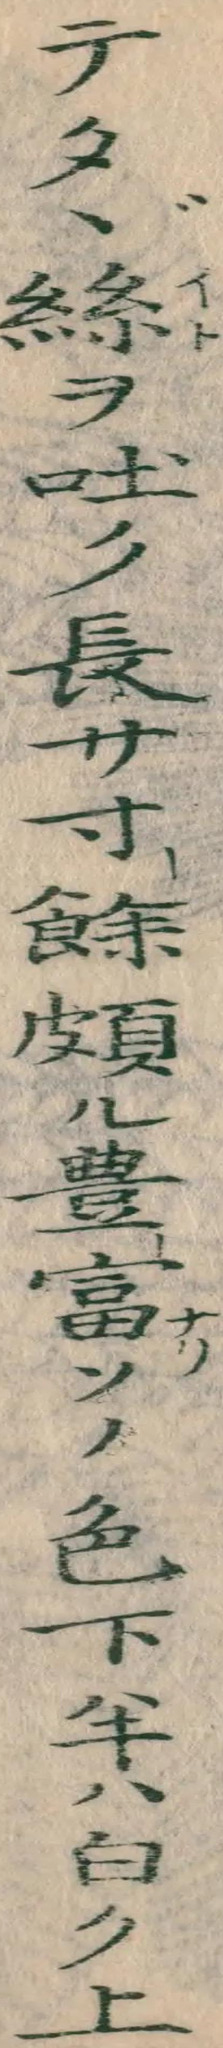テタヾ糸ヲ吐ク長サ寸-余頗ル豊-富ソノ色下半ハ白ク上
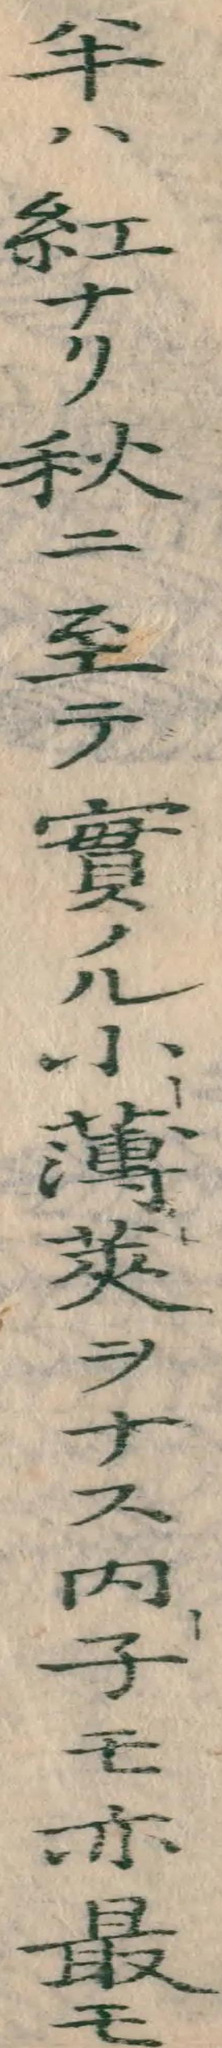半ハ紅ナリ秋ニ至テ実ノル小-薄-莢ヲナス内-子モ亦最モ
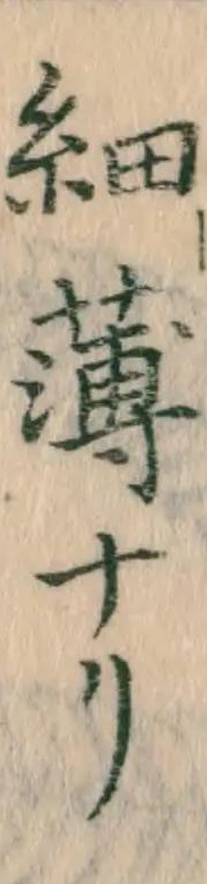細-薄ナリ

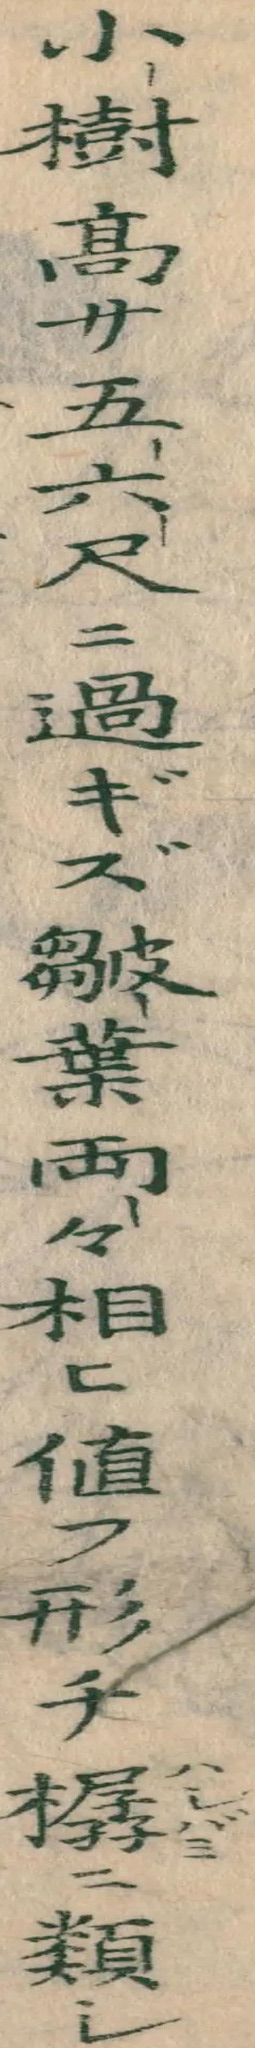小-樹高サ五-六-尺ニ過ギズ皺-葉両-々相ヒ値フ形チ榛ニ類シ
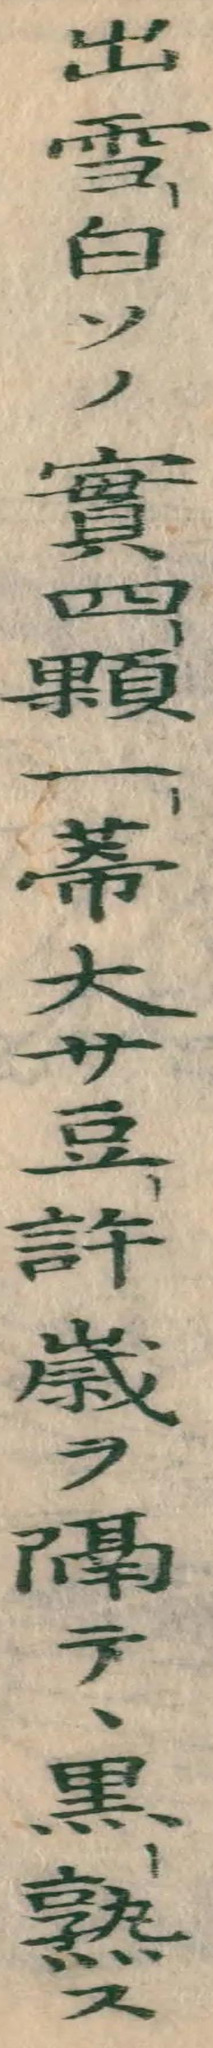出雪-白ソノ実四-顆一-蒂大サ豆-許歳ヲ隔テヽ黒-熟ス

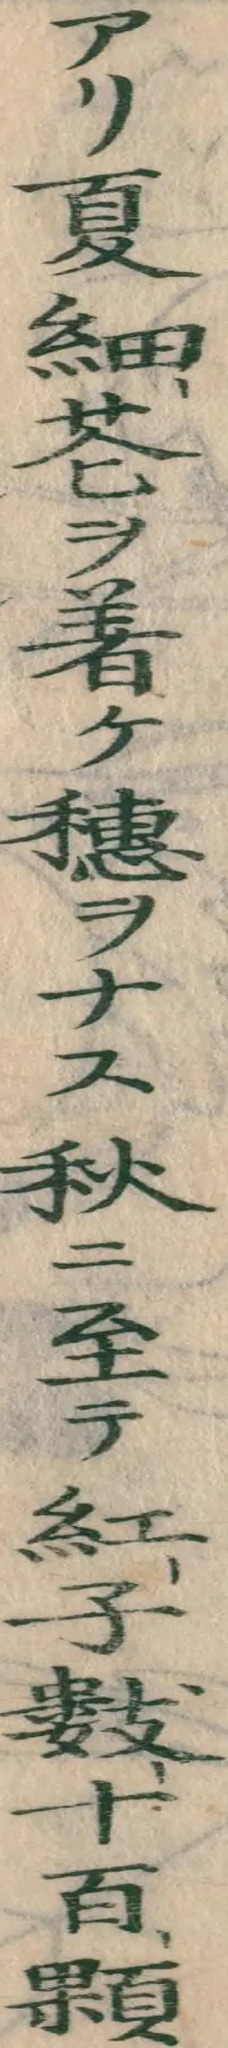アリ夏細-花ヲ着ケ穂ヲナス秋ニ至テ紅-子数-十百-顆
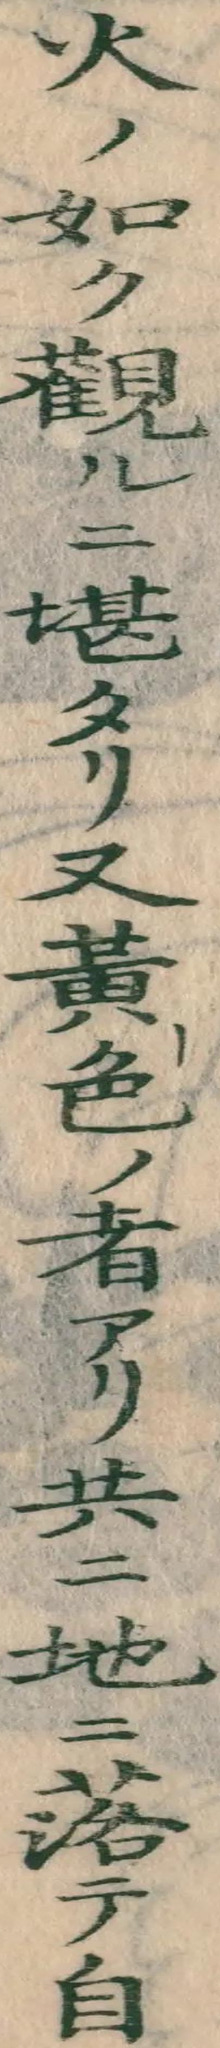火ノ如ク観ルニ堪タリ又黄-色ノ者アリ共ニ地ニ落テ自
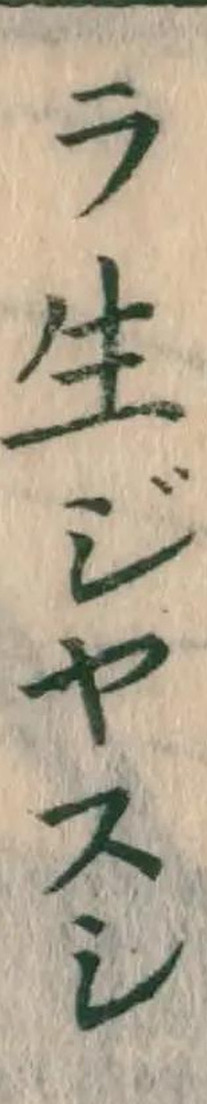ラ生ジヤスシ
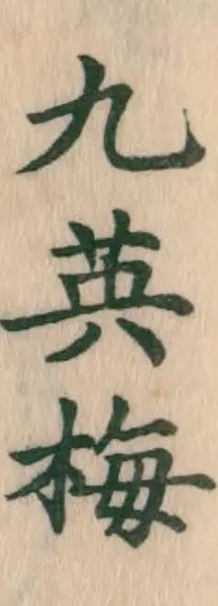九英梅

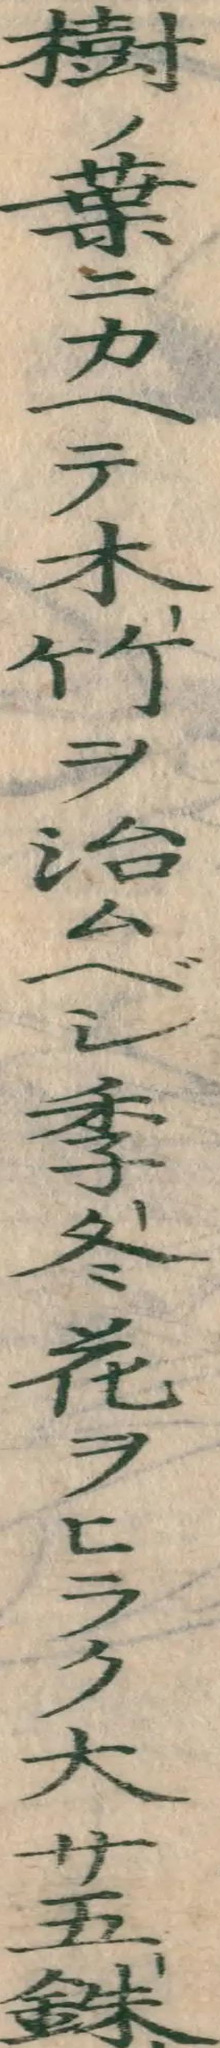樹ノ葉ニカヘテ木-竹ヲ治ムベシ季-冬花ヲヒラク大サ五-銖-
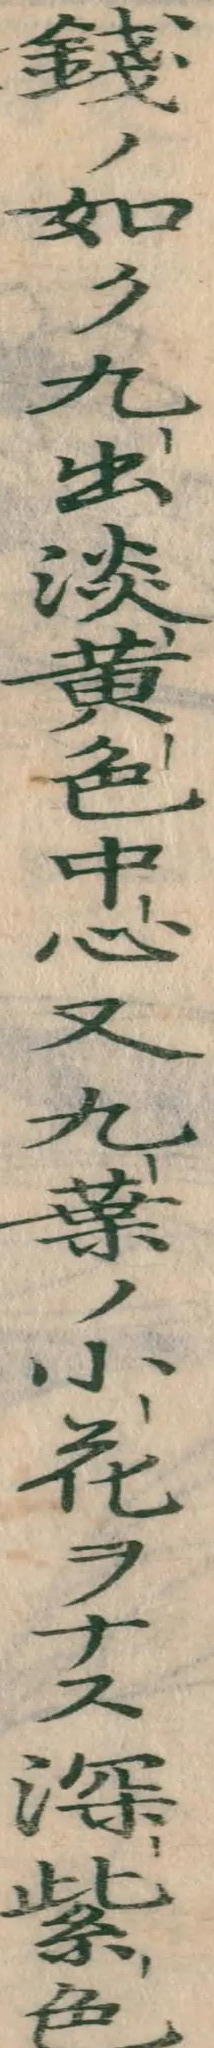銭ノ如ク九-出淡-黄-色中-心又九-葉ノ小-花ヲナス深-紫-色
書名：花彙 草部4巻木部4巻. [2]
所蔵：国立国会図書館 National Diet Library, JAPAN
